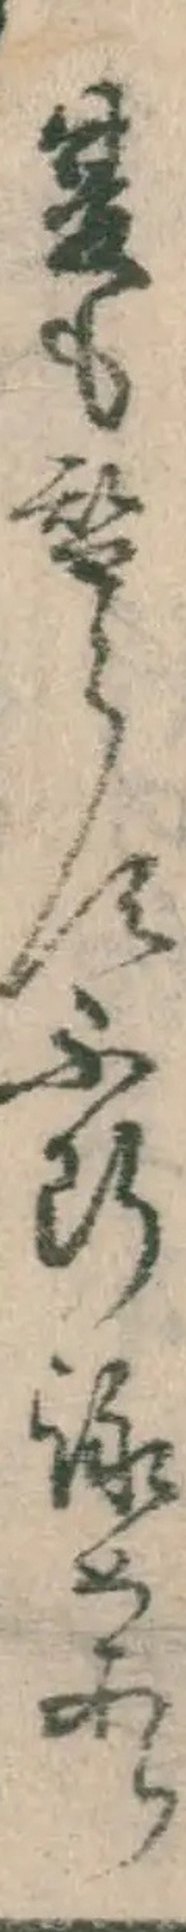夏も替らす不断詠めあり
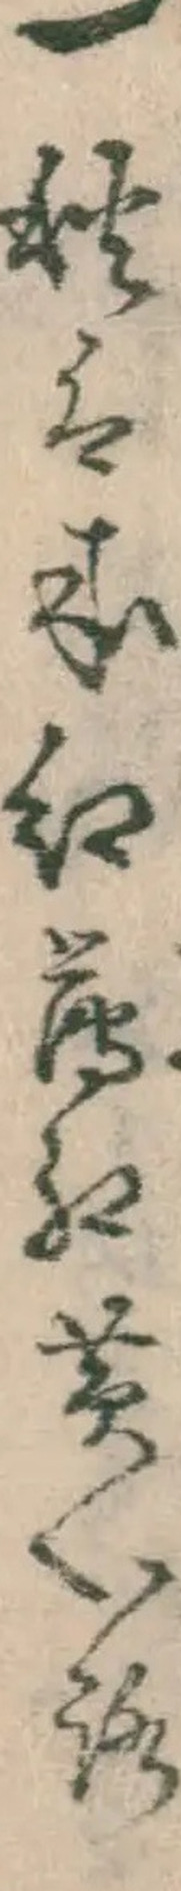秋は本紅薄紅黄いろ
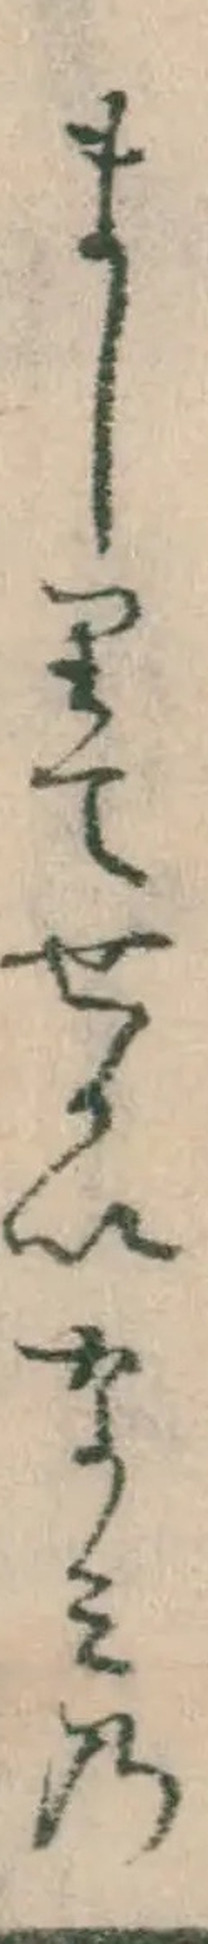ましりてせかいなみの
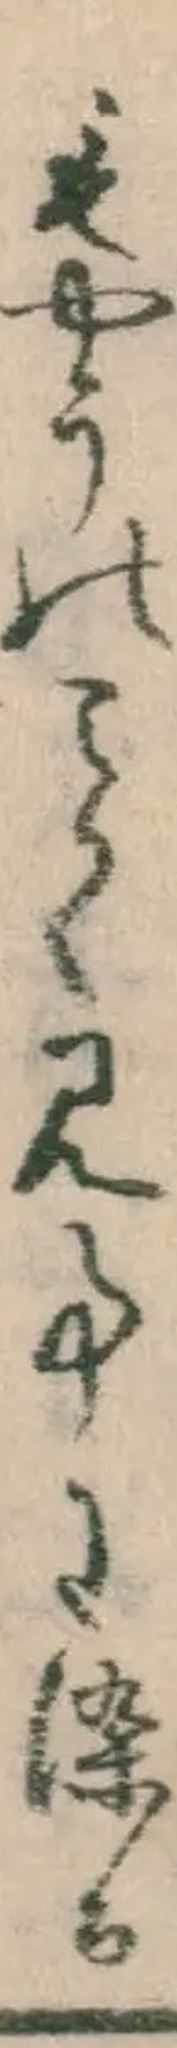もやうのごとく見事に染る
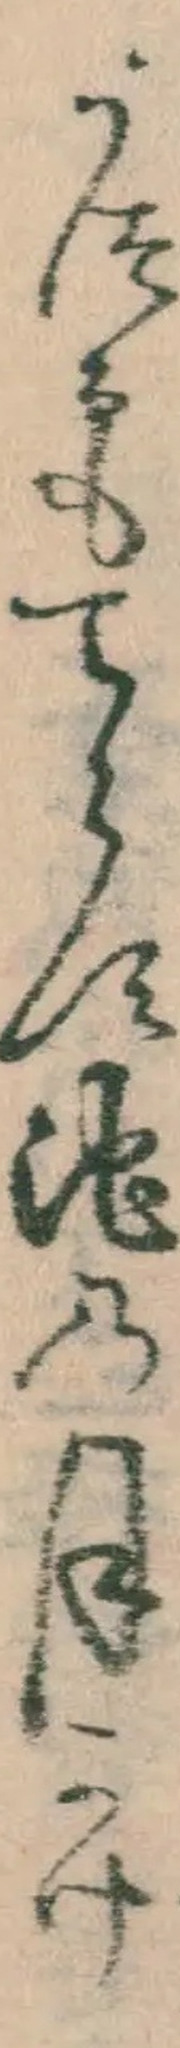うつるもてらす池の月かけ
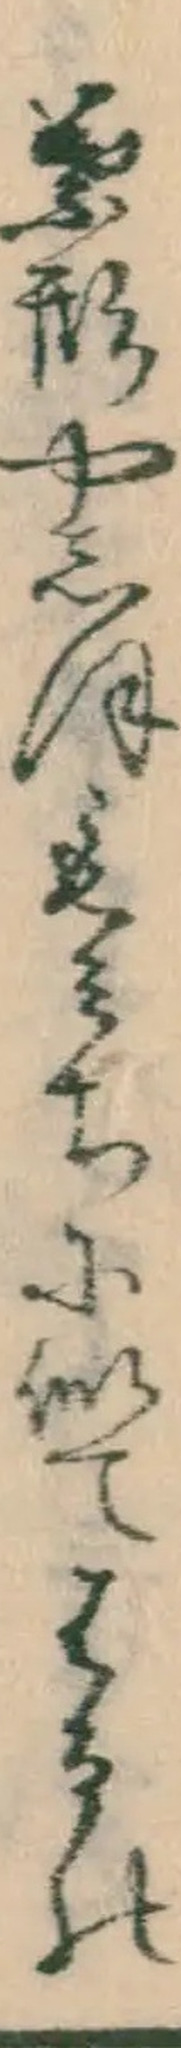初花葉形やしほもみちに似てはるの
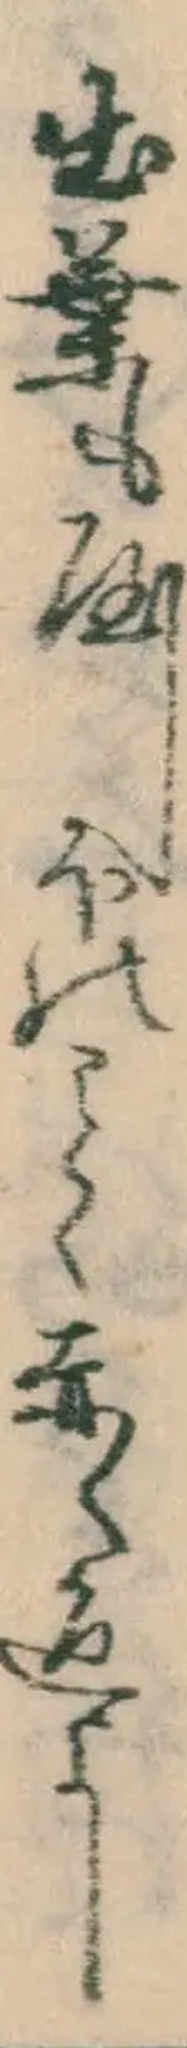出葉もやしほのことく赤く色よし
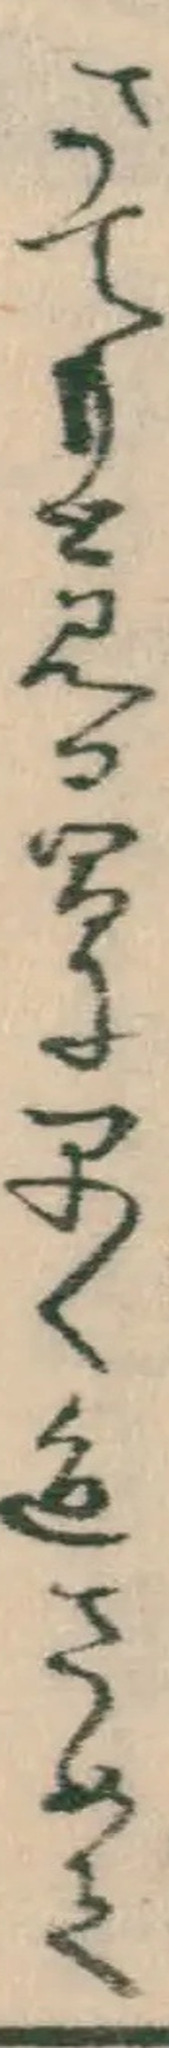さてもと見る間に早々色さめて
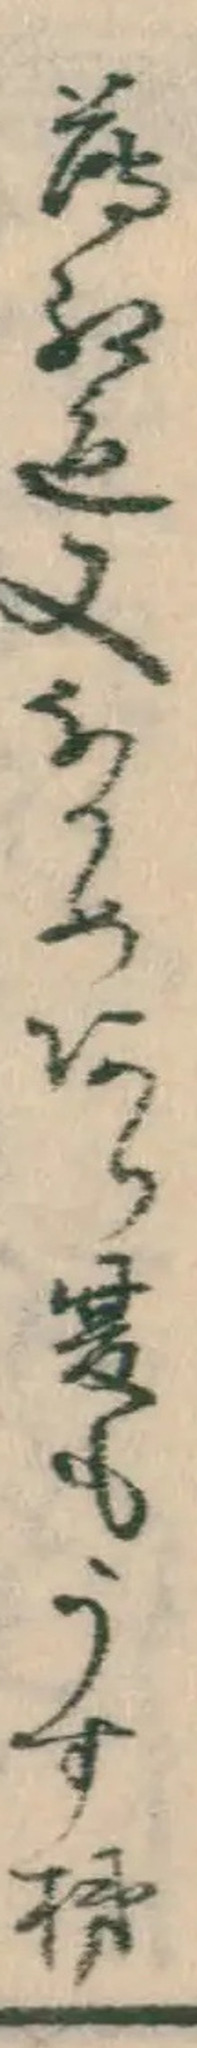薄紅色又なかめあり夏もうす柿
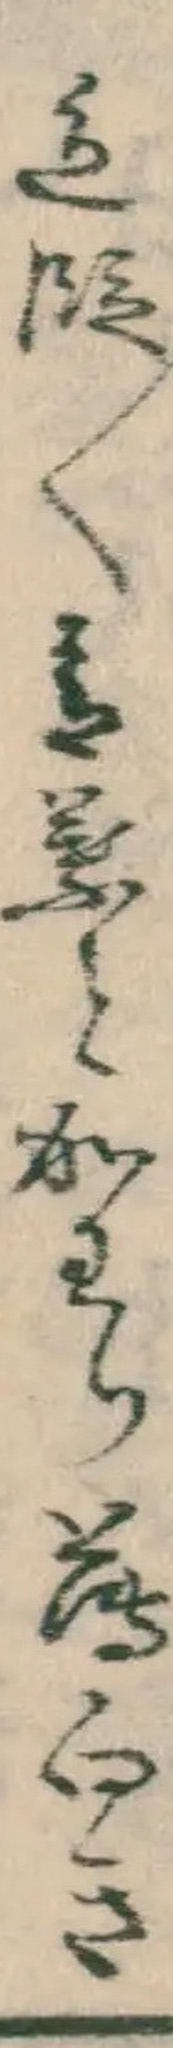色段〳〵青葉とかわり薄白き
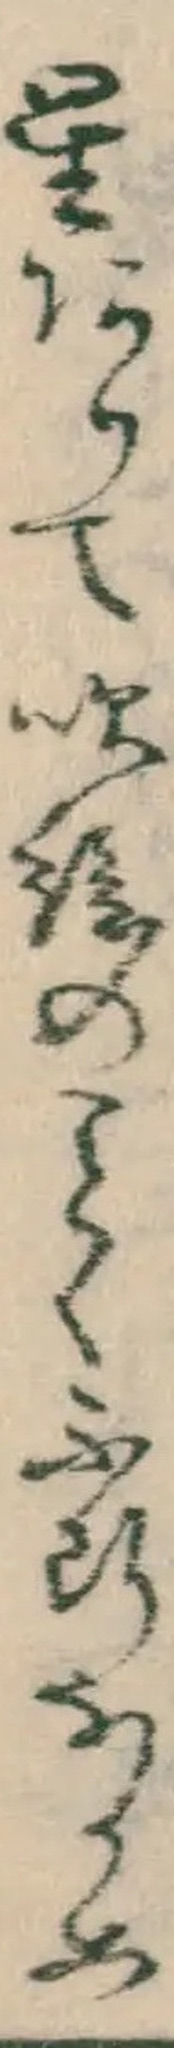星ありて吹絵のことく不断なかめ
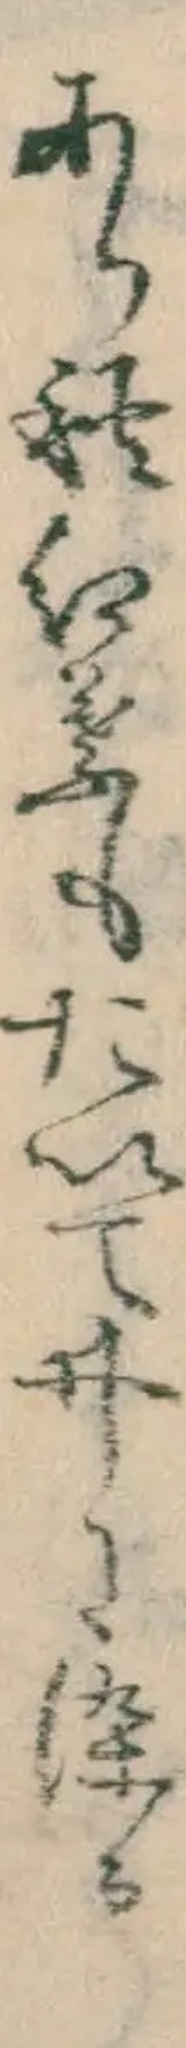あり秋紅葉もたいてゐに染る
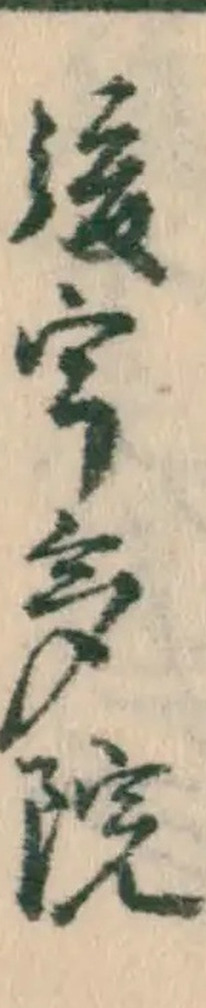後宇多院
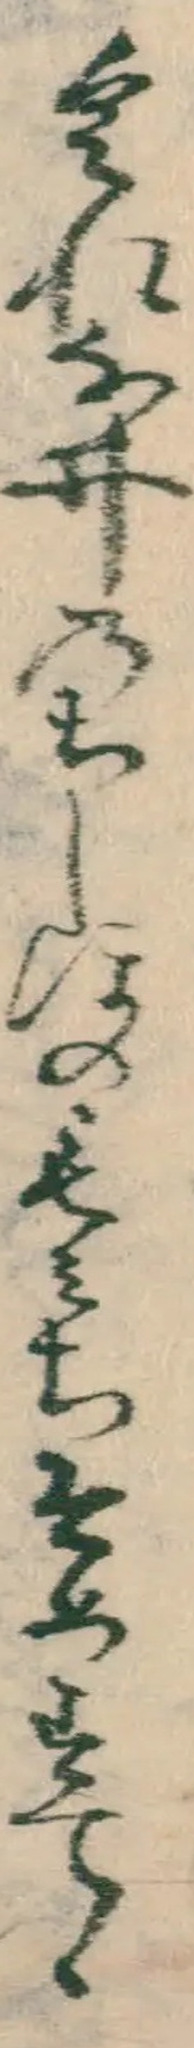くれなゐのちしほのもみちそめすてゝ
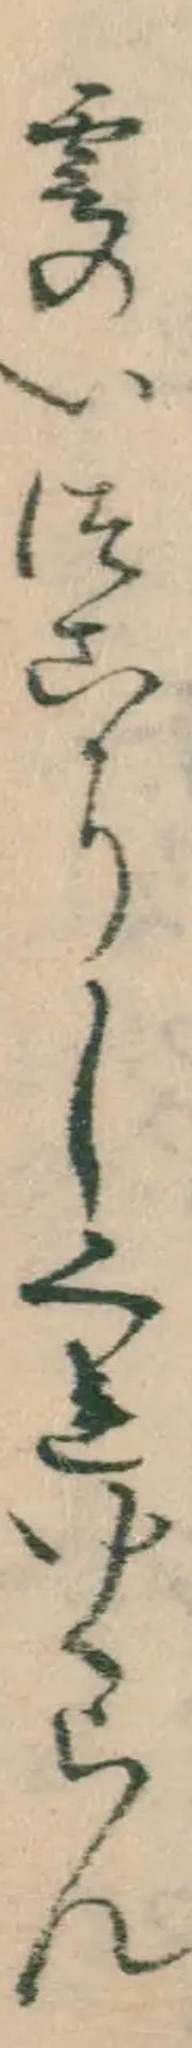雲のいつこにしくれゆくらん

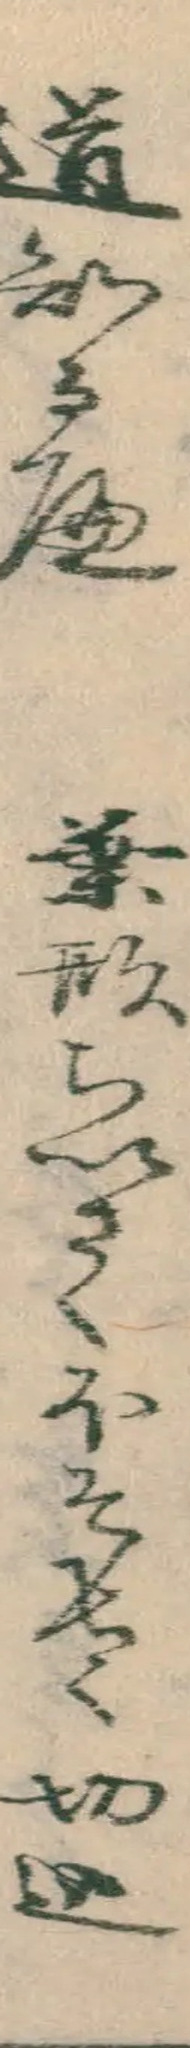道知るへ葉形ちいさくほそ長く切込
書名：紅葉集
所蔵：国立国会図書館 National Diet Library, JAPAN
